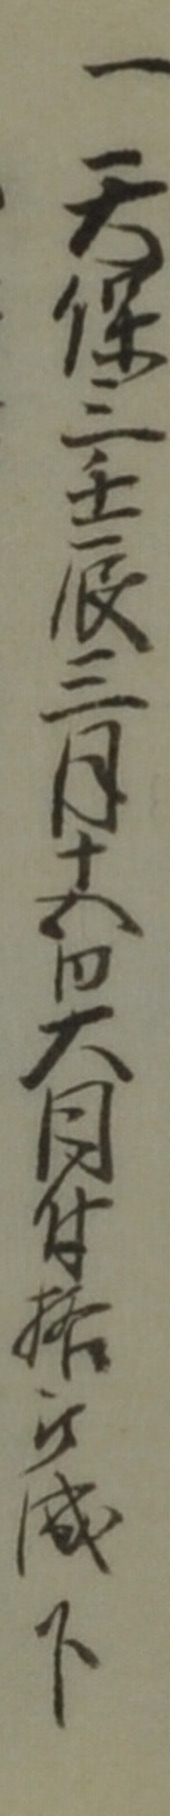一天保三壬辰三月十五日大目付格被成下
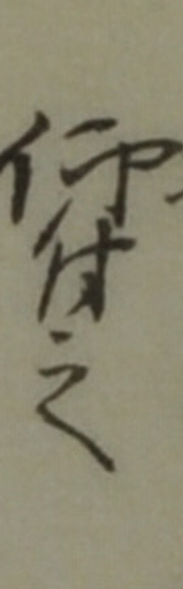仰付之
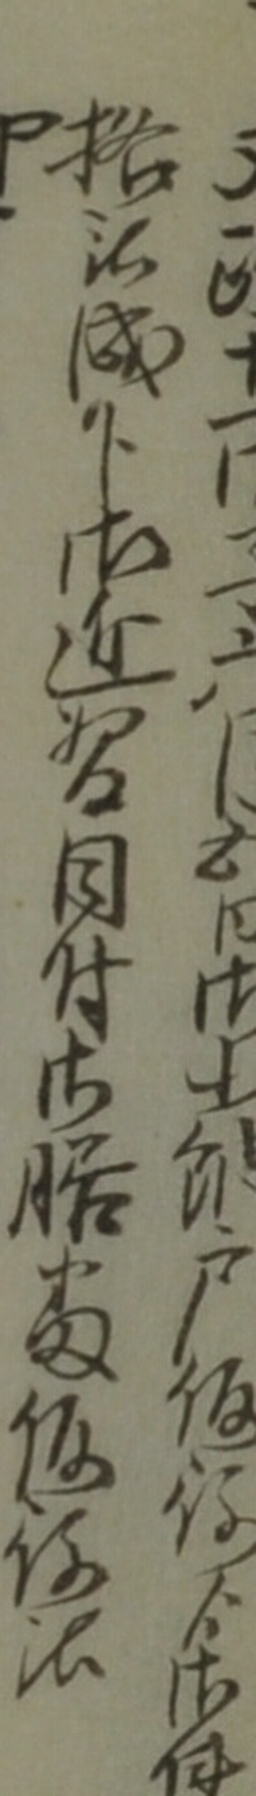格被成下御近習目付御膳番仮役被
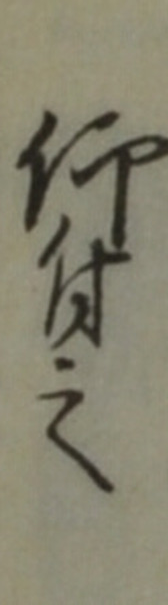仰付之
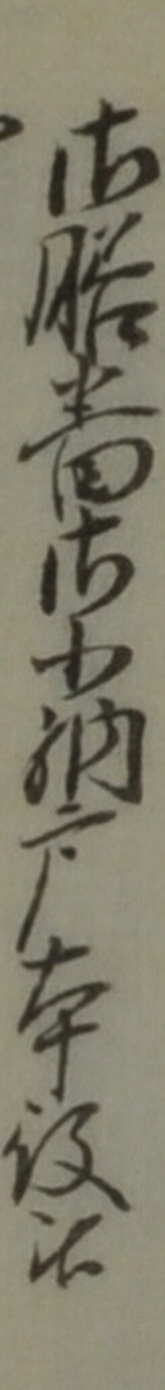御膳番御小納戸本役被
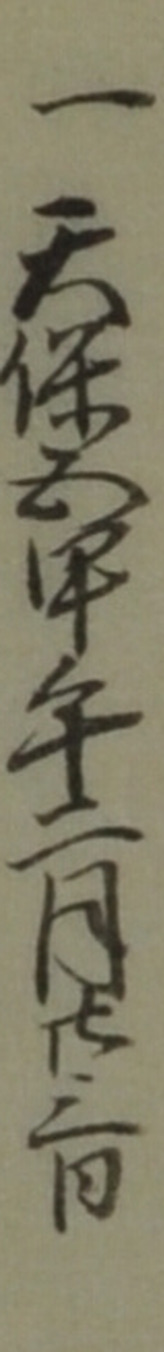一天保五甲午二月廿三日
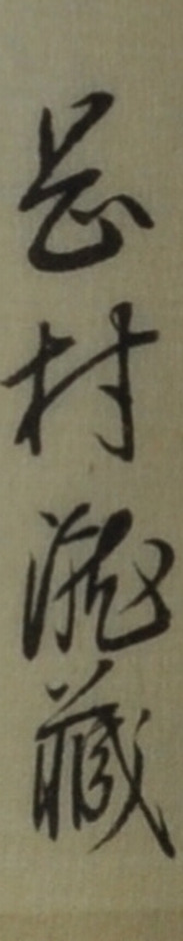岡村瀧蔵
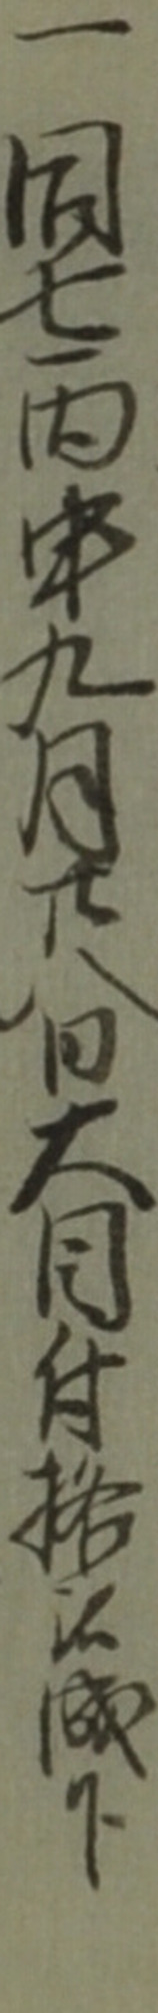一同七丙申九月廿八日大目付格被成下
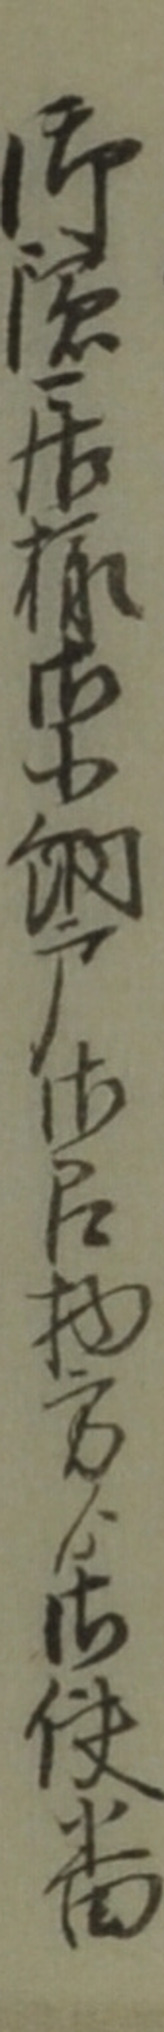御隠居様御小納戸御召物方ゟ御使番
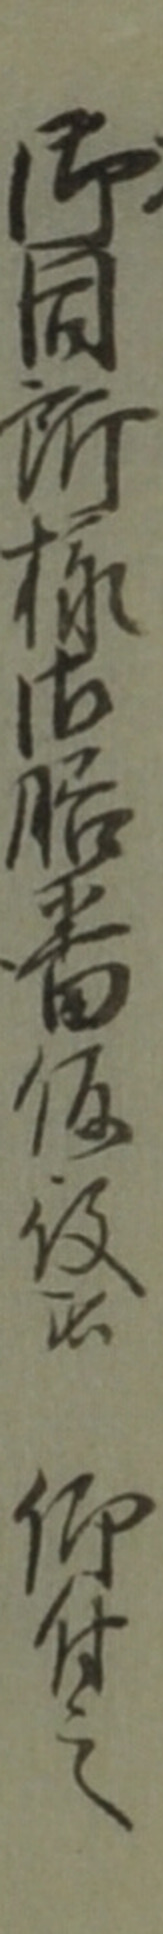御同所様御膳番仮役被仰付之
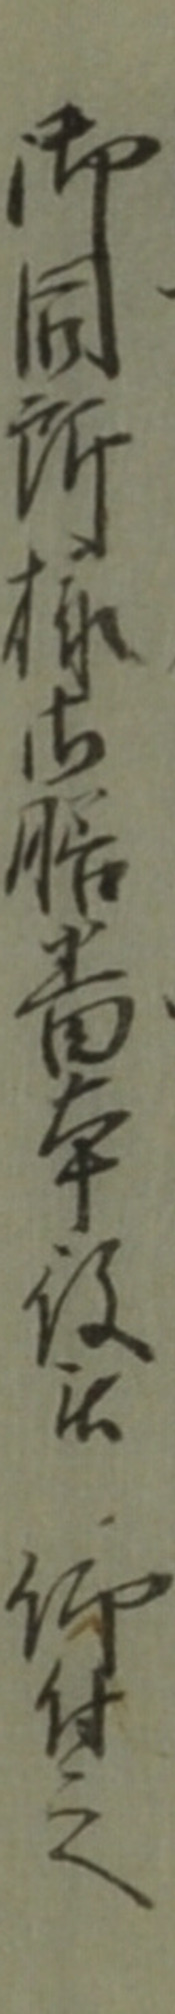御同所様御膳番本役被仰付之
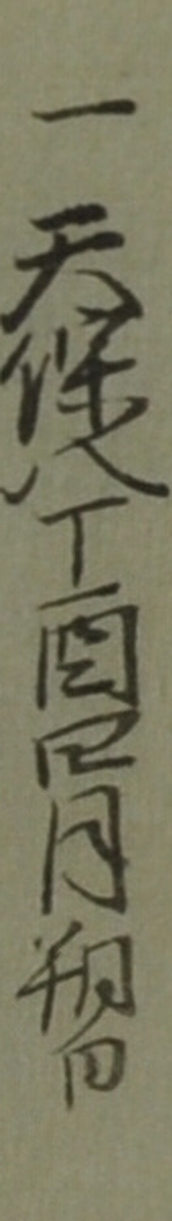一天保八丁酉四月朔日
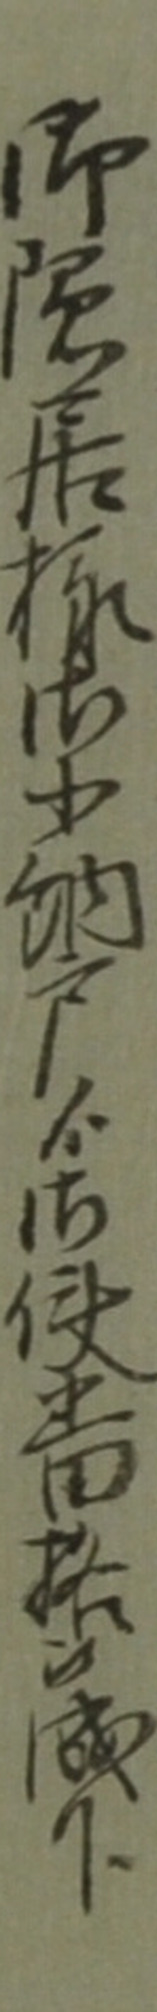御隠居様御小納戸ゟ御使番格被成下
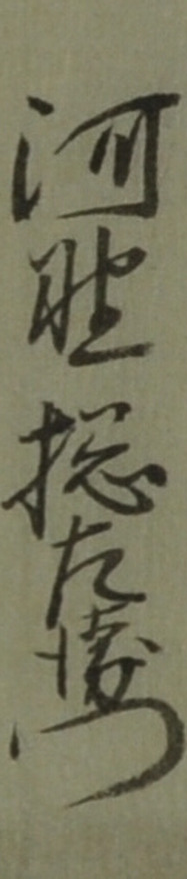河野捴左衛門
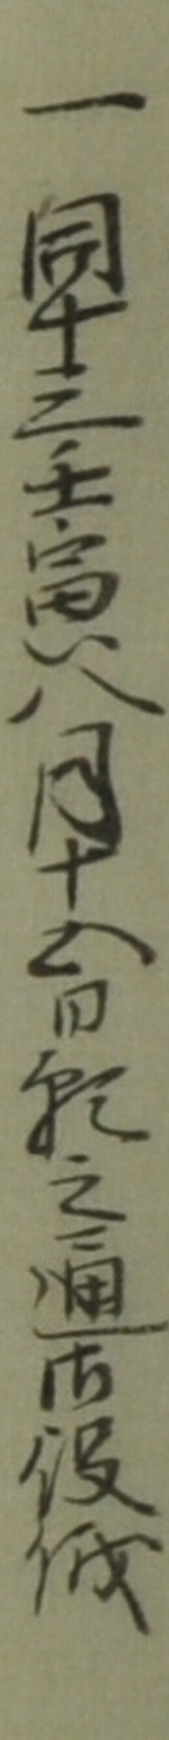一同十三壬寅八月十五日願之通御役儀
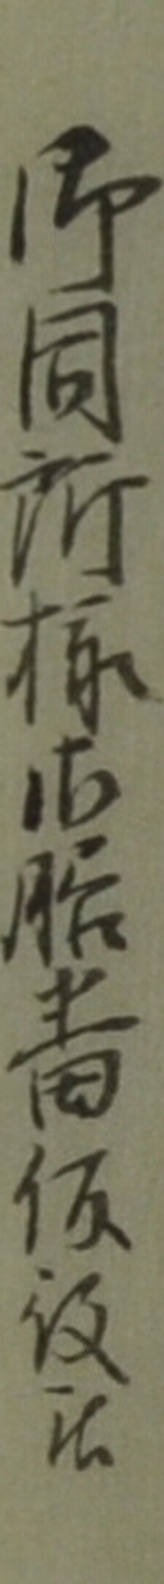御同所様御膳番仮役被
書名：諸御役代々録（四）
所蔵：伊那市立高遠町図書館・合同会社AMANE
